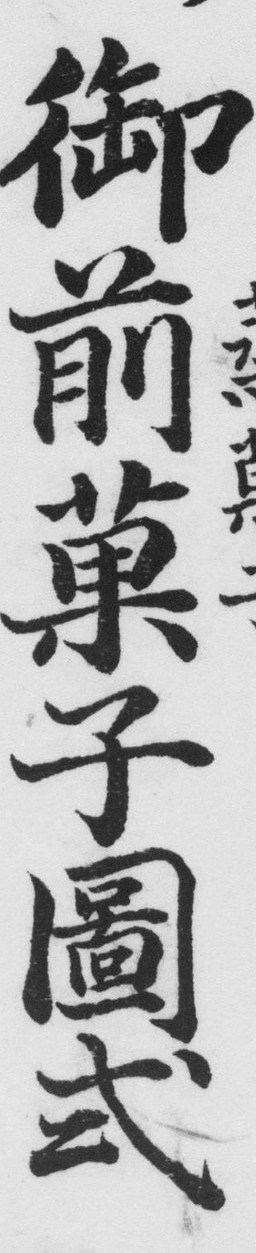御前菓子図式
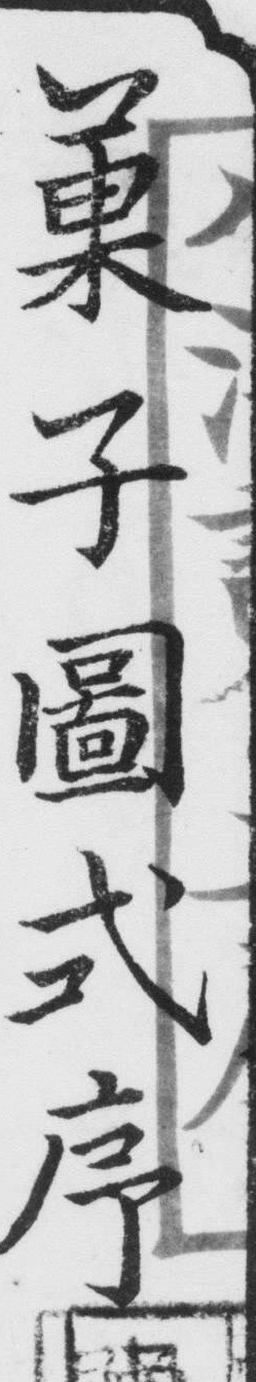菓子図式序
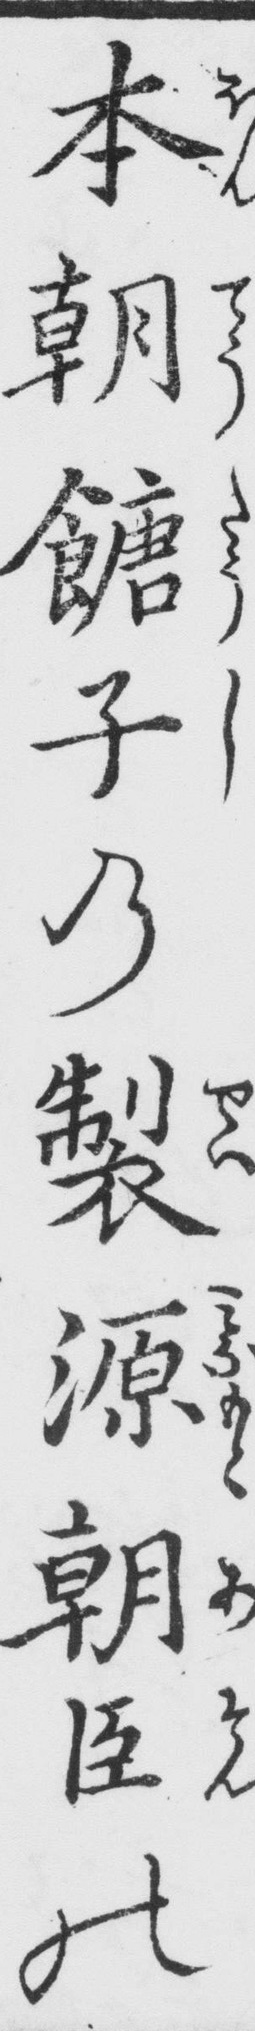本朝餹子の製源朝臣の
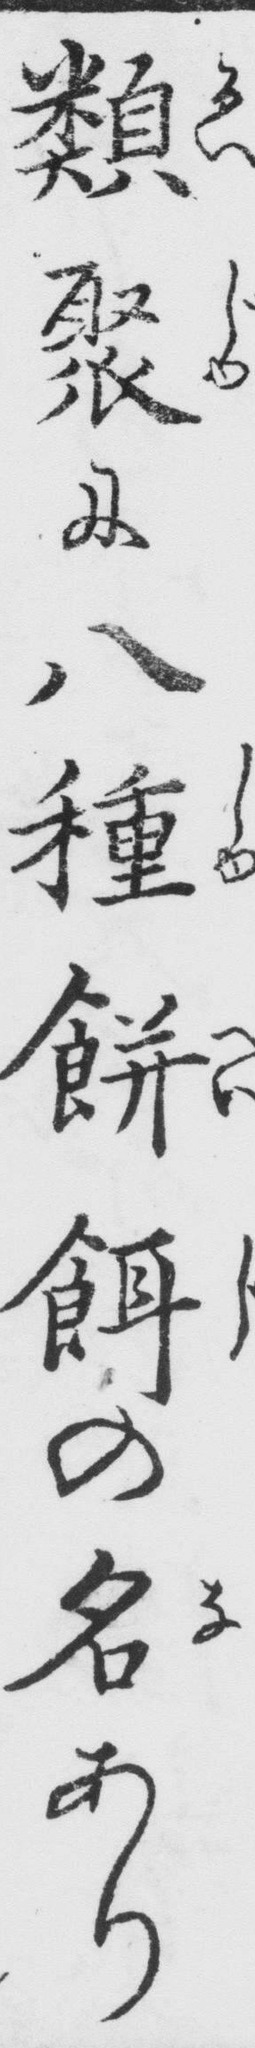類聚に八種餅餌の名あり
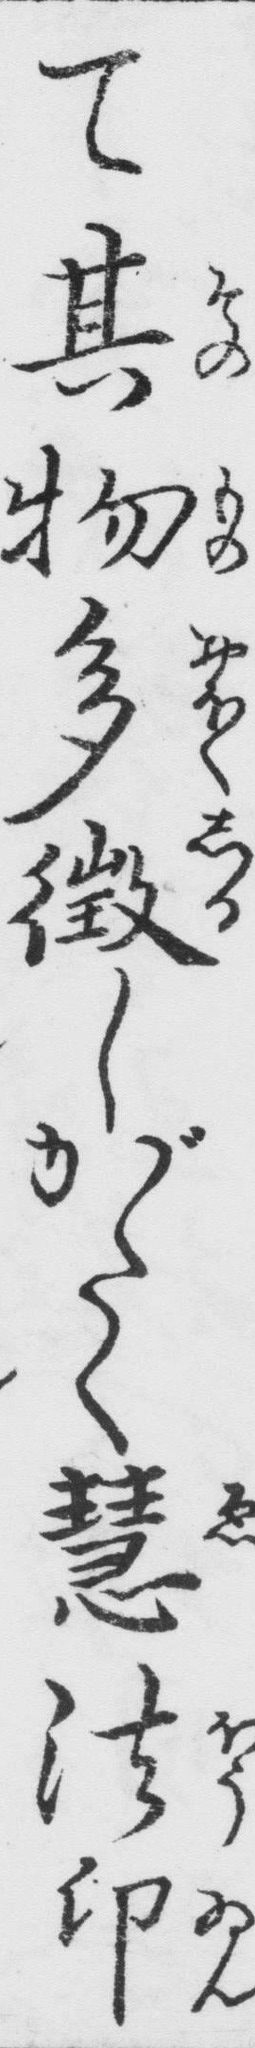て其物多徴しがたく慧法印

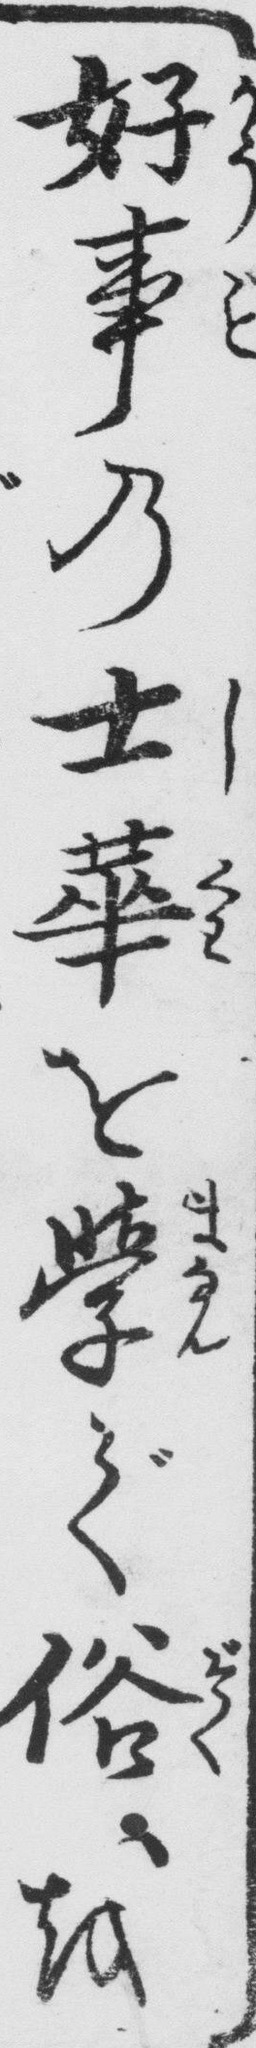好事の士華を学で俗を
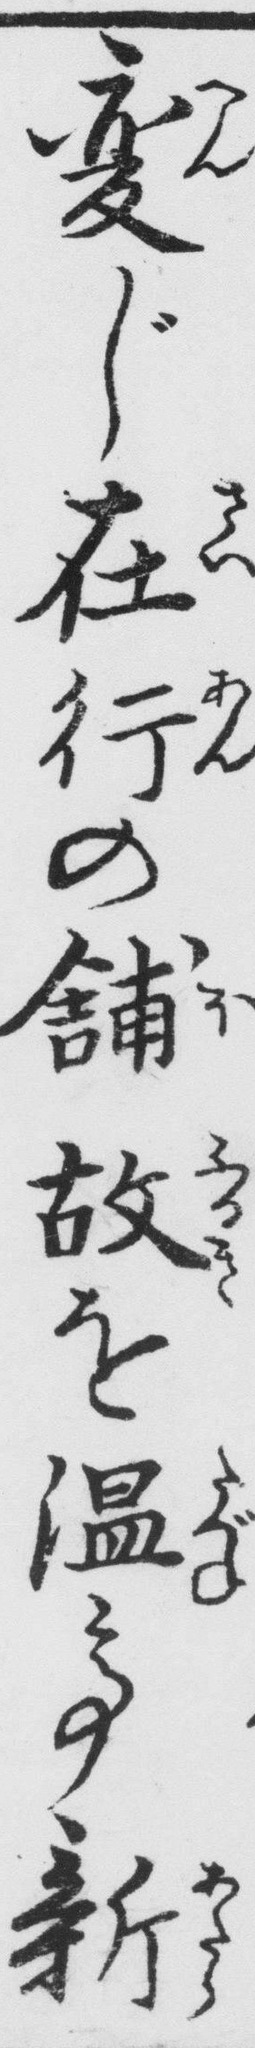変じ在行の舗故を温て新
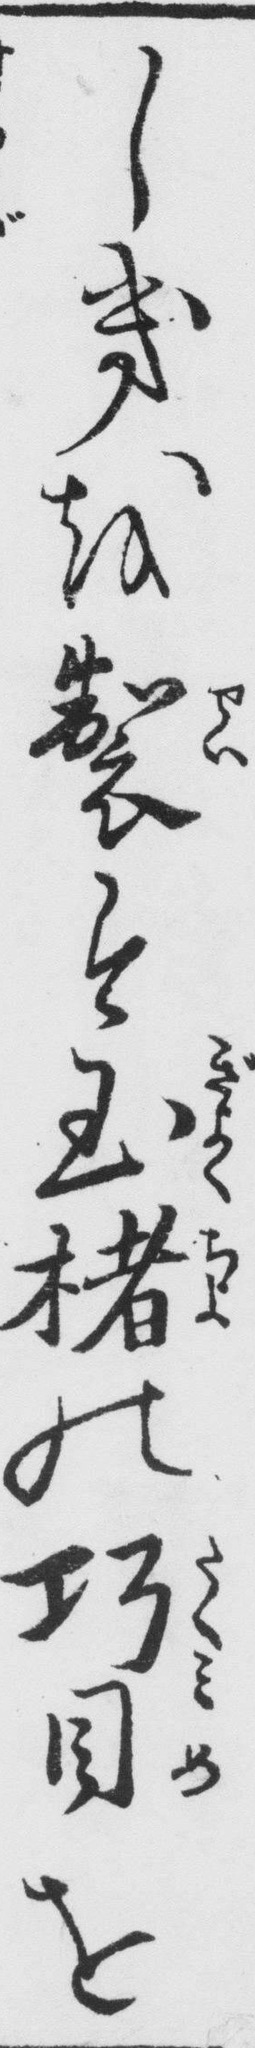しきを製す玉楮の巧目を
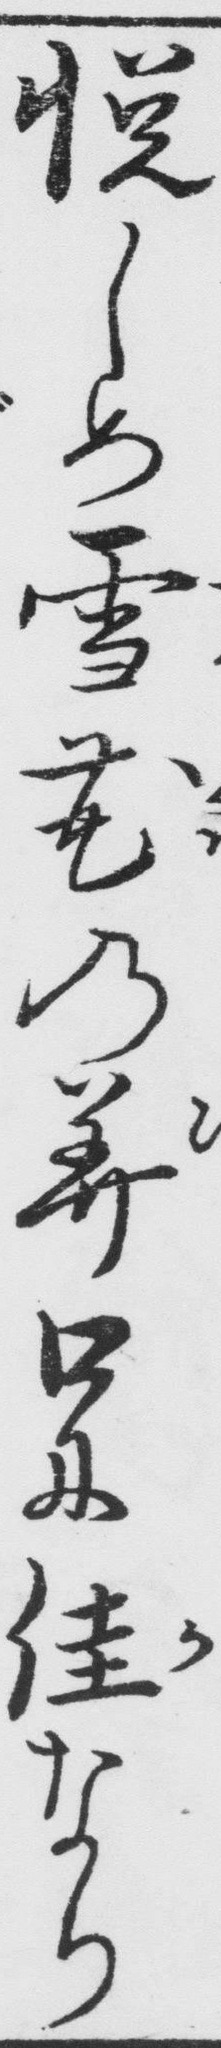悦しめ雪花の美口に佳なり
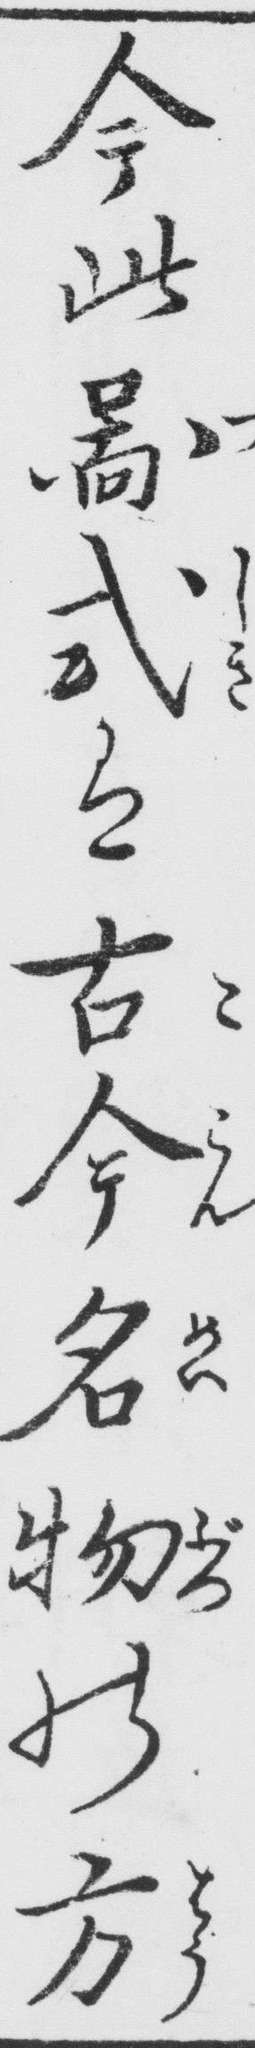今此図式は古今名物の方
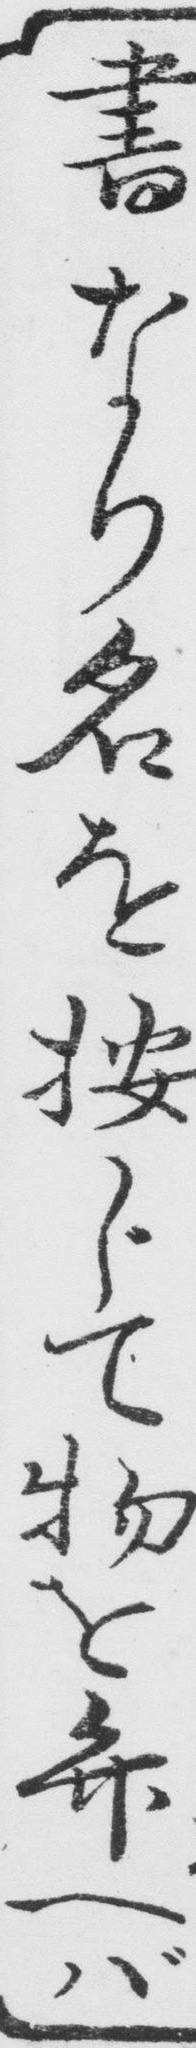書なり名を按じて物を弁へば
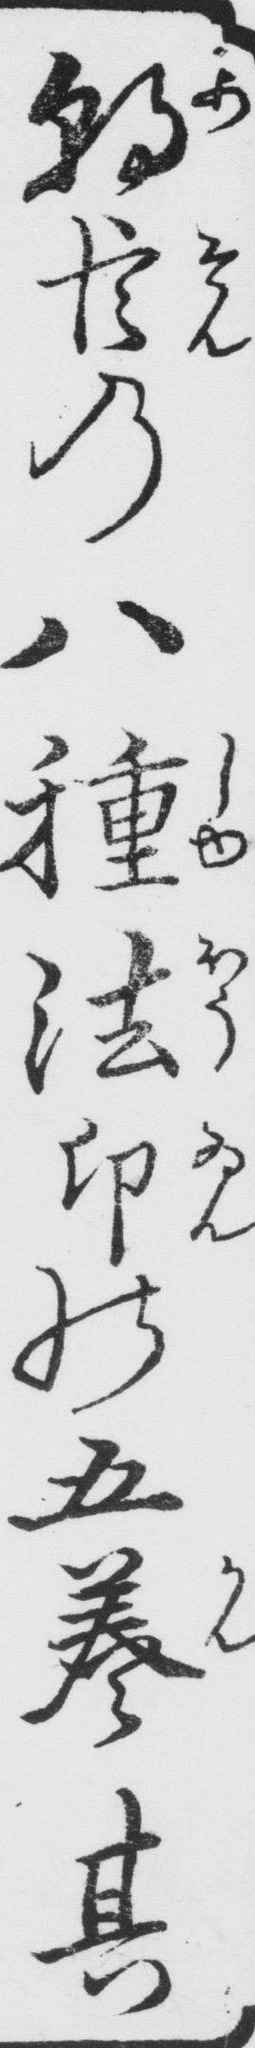朝臣の八種法印の五巻其
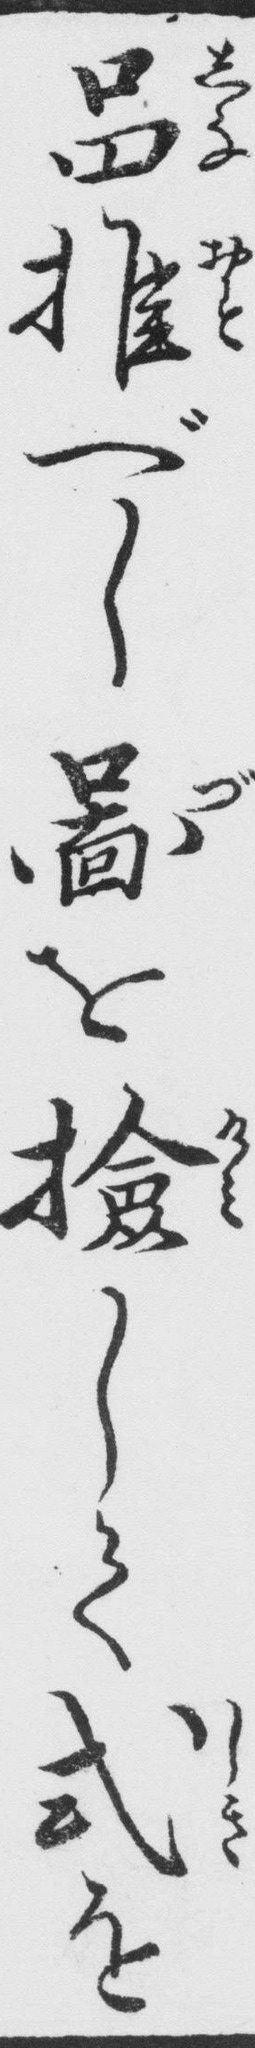品推べし図を検して式を
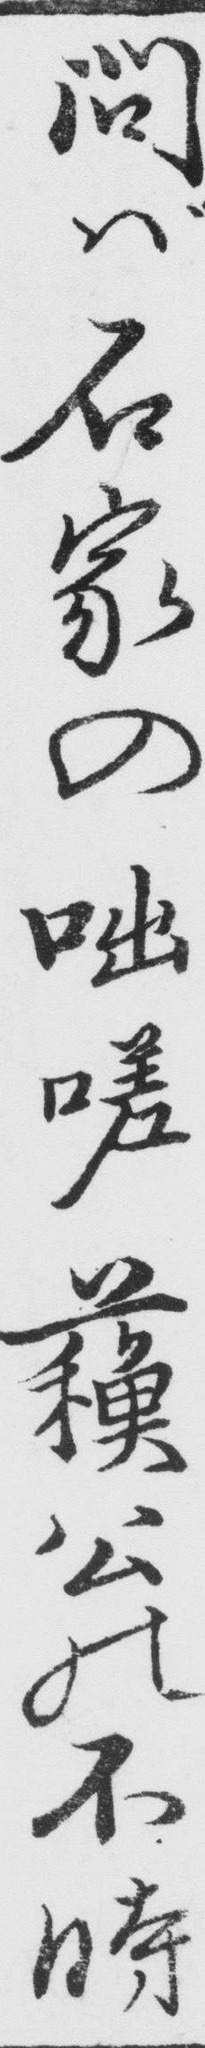問ば石家の咄嗟蘓公の不時
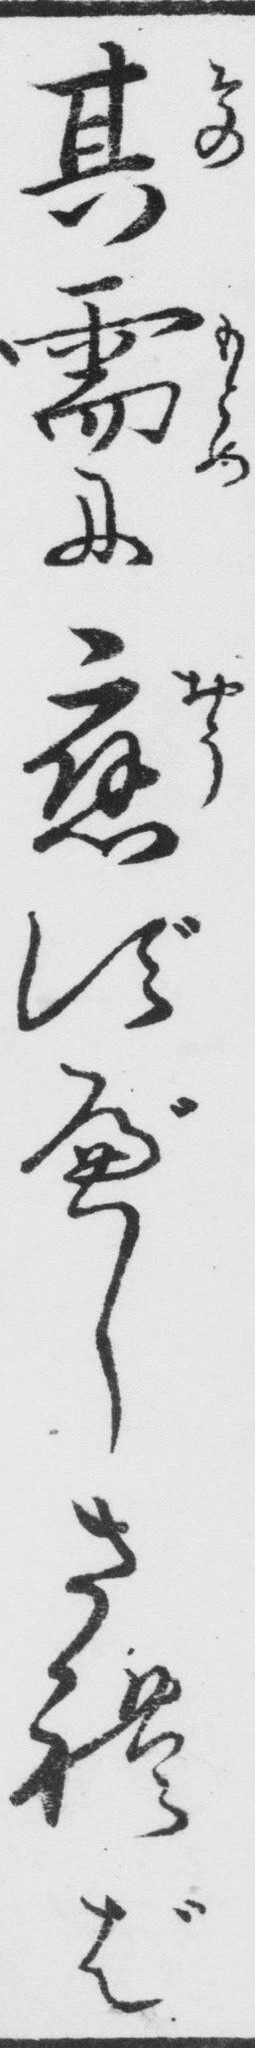其需に応ずべしされば
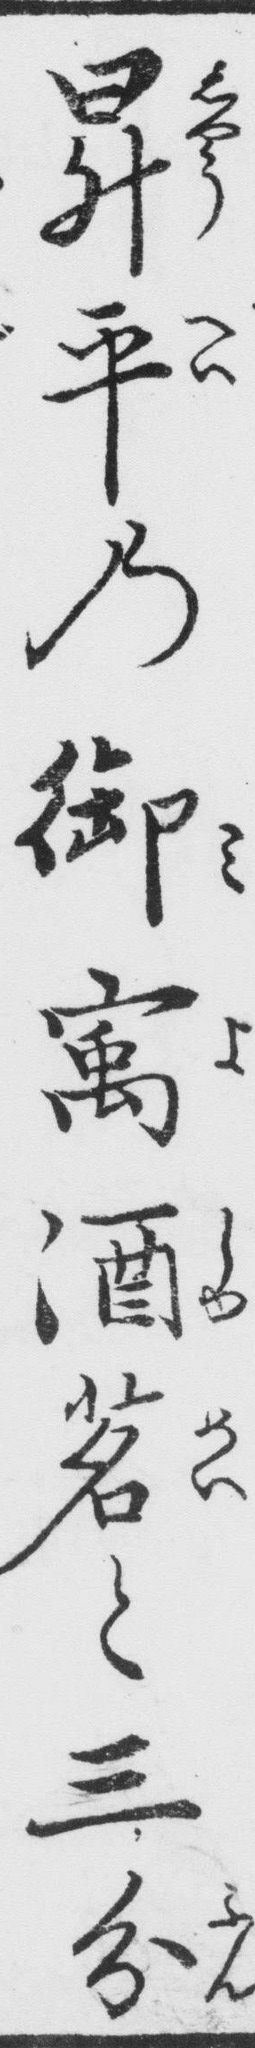昇平の御寓酒茗と三分
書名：御前菓子図式
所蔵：大阪府立大学学術情報センター 国文学研究資料館
